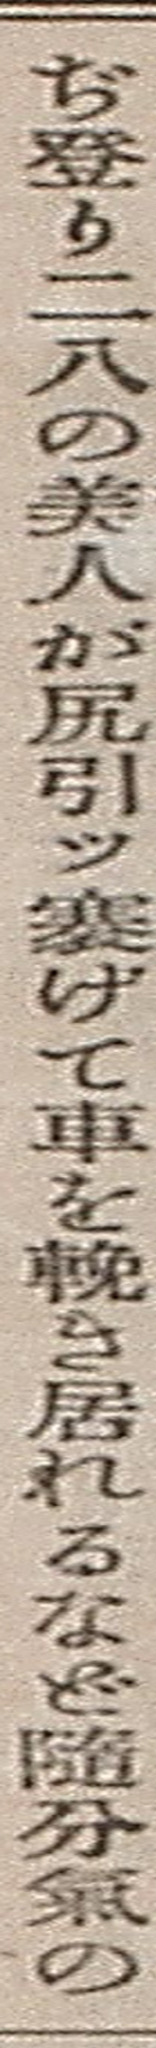ぢ登り二八の美人が尻引ツ褰げて車を輓き居れるなど随分気の
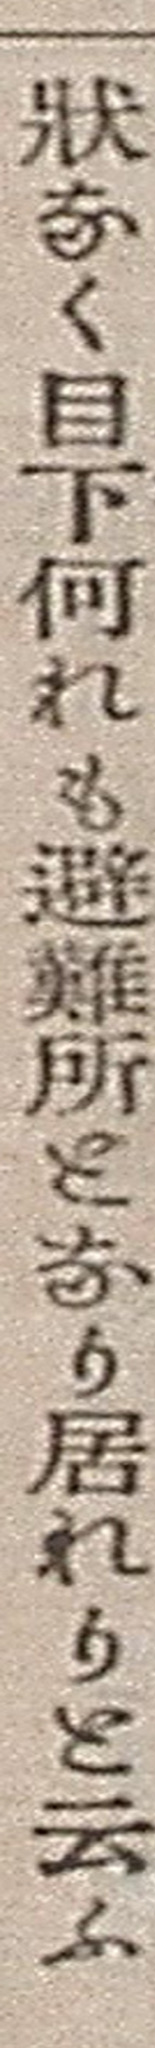状なく目下何れも避難所となり居れりと云ふ
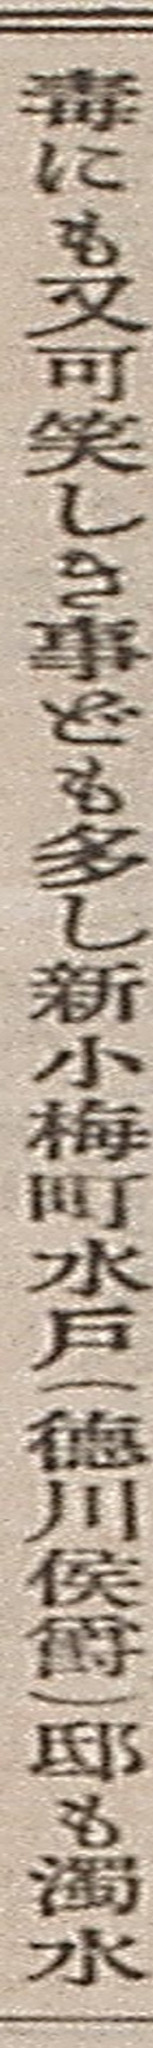毒にも又可笑しき事ども多し新小梅町水戸）邸も濁水
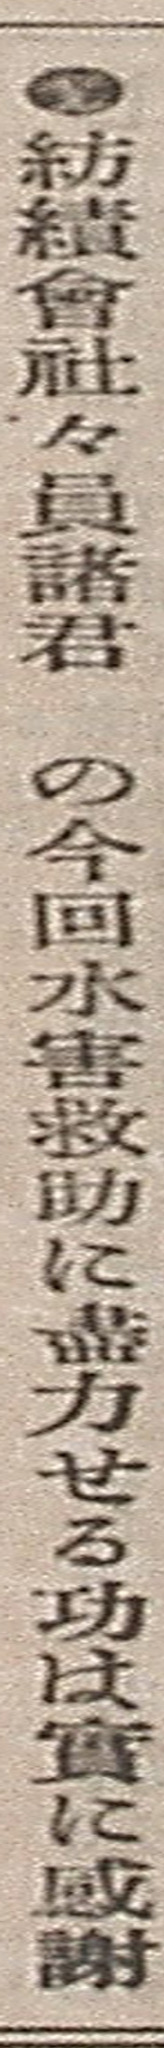●紡績会社々員諸君の今回水害救助に尽力せる功は実に感謝
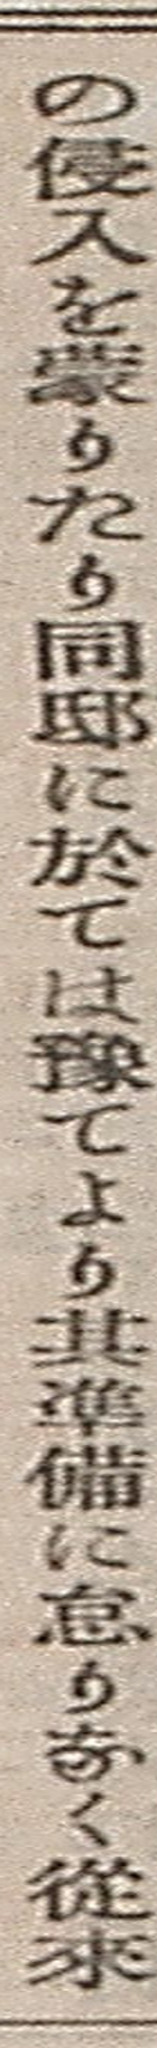の侵入を蒙りたり同邸に於ては予てより其準備に怠りなく従来
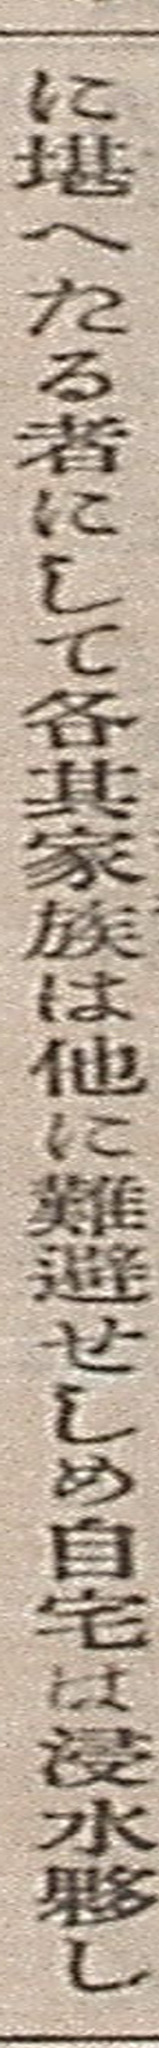に堪へたる者にして各其家族は他に避難せしめ自宅は浸水夥し
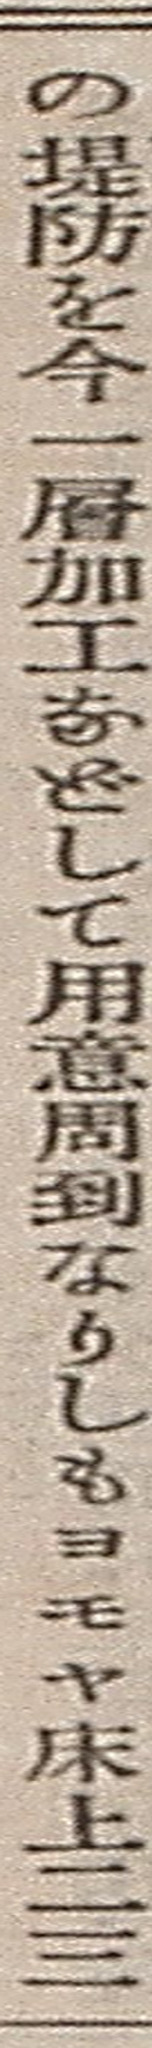の堤防を今一層加工などして用意周到なりしもヨモヤ床上二三
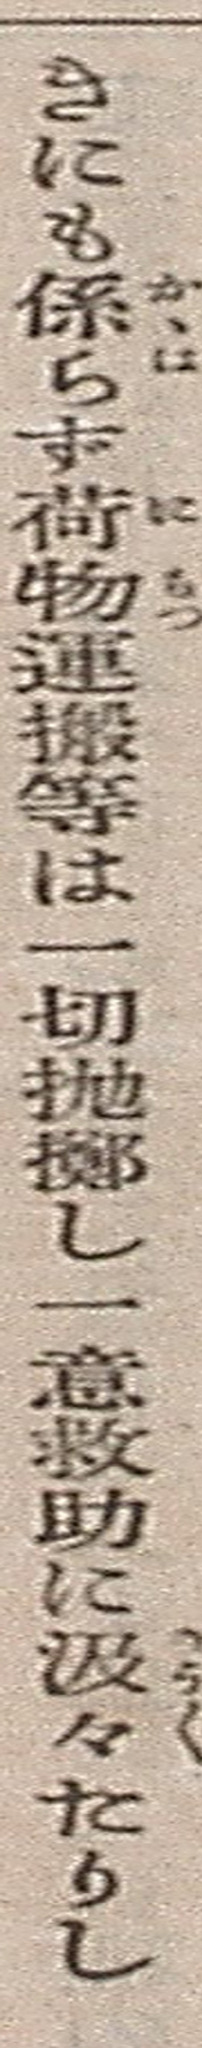きにも係らず荷物運搬等は一切抛擲し一意救助に汲々たりし
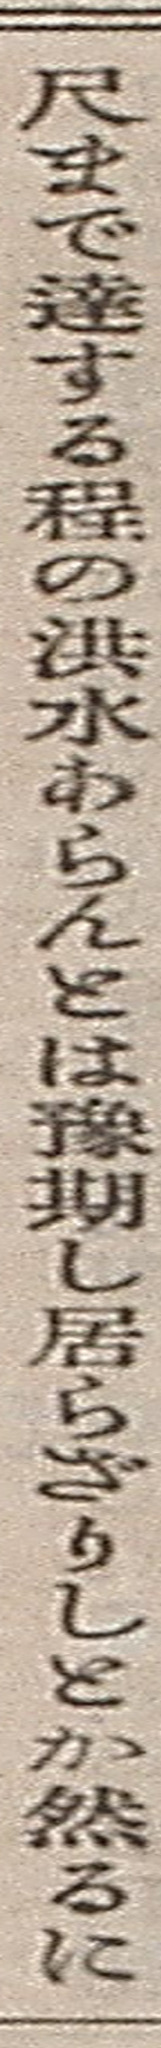尺まで達する程の洪水あらんとは予期し居らざりしとか然るに
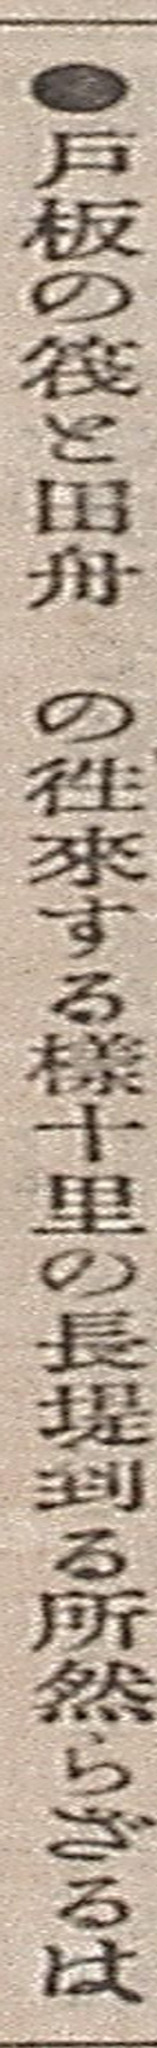●戸板の筏と田舟の往来する様十里の長堤到る所然らざるは
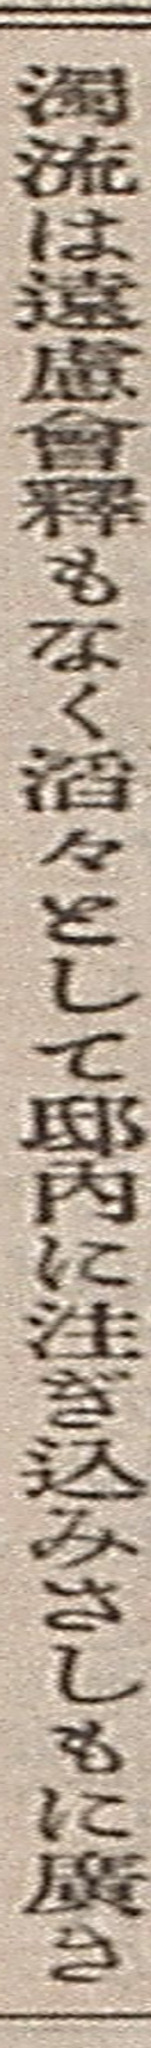濁流は遠慮会釈もなく滔々として邸内に注ぎ込みさしもに広き
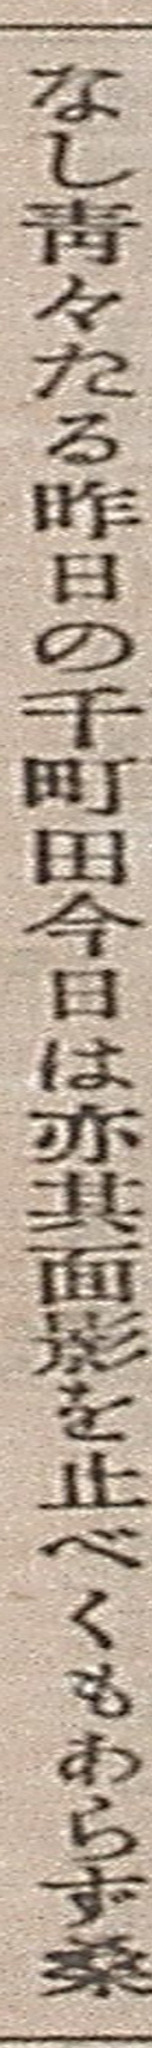なし青々たる昨日の千町田今日は亦其面影を止べくもあらず桑
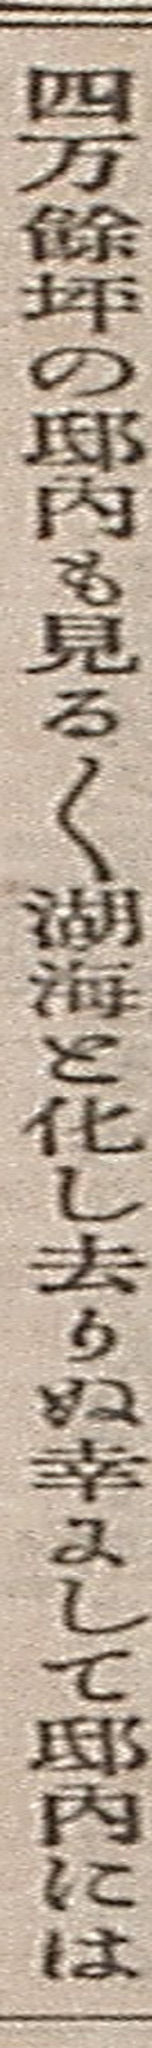四万余坪の邸内も見る〳〵湖海と化し去りぬ幸にして邸内には
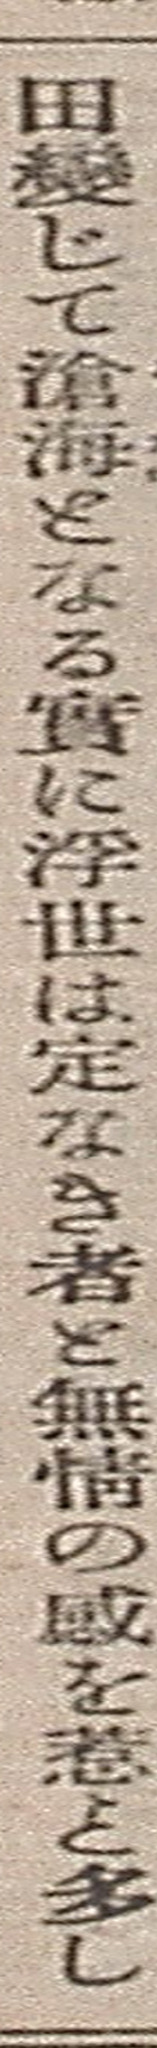田変じて滄海となる実に浮世は定なき者と無情の感を惹こと多し
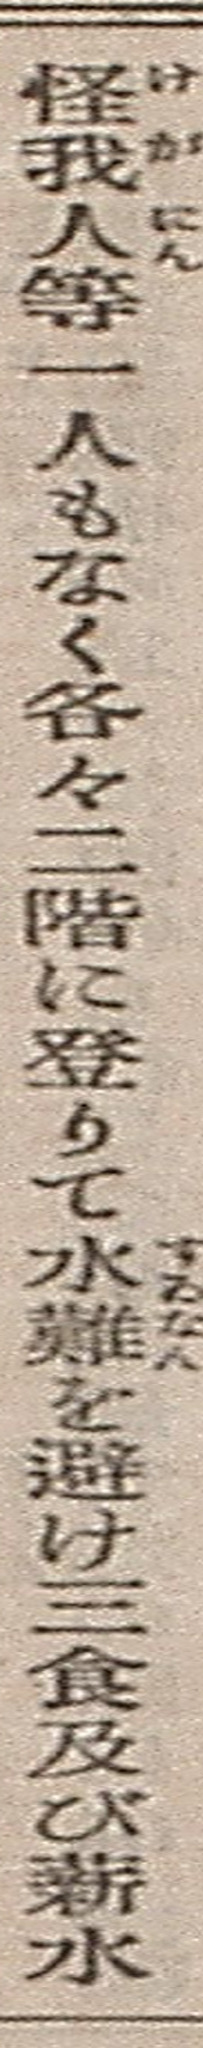怪我人等一人もなく各々二階に昇りて水難を避け三食及び薪水
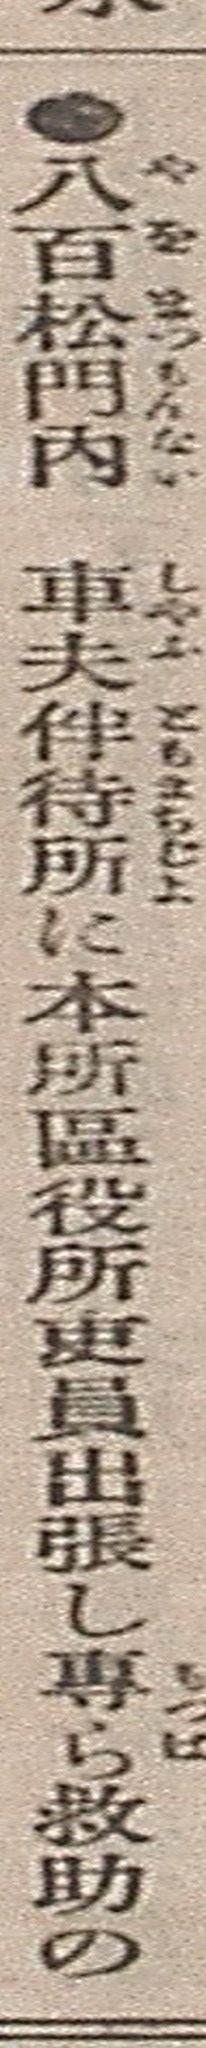●八百松門内車夫伴待所に本所区役所吏員出張し専ら救助の
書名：風俗畫報臨時増刊第百二十四號　洪水地震被害録（上）
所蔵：東京大学地震研究所図書室 Earthquake Research Institute Library, The University of Tokyo, JAPAN
